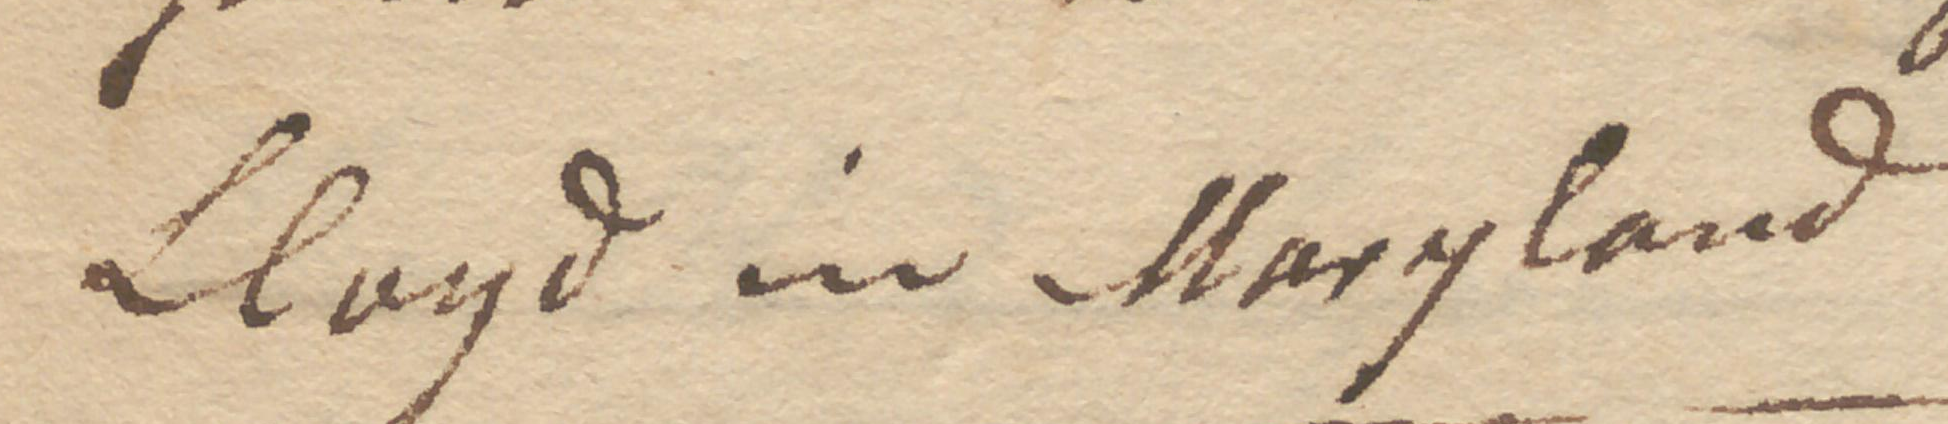Lloyd in Maryland
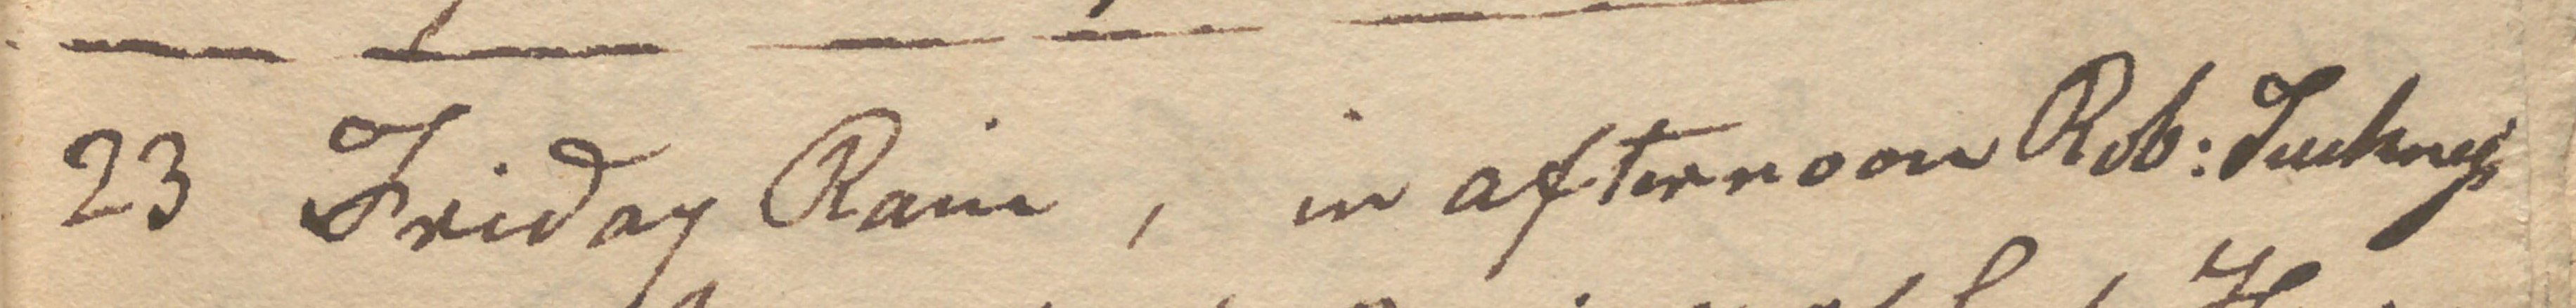23 Friday Rain, in afternoon Rob: Tuckness
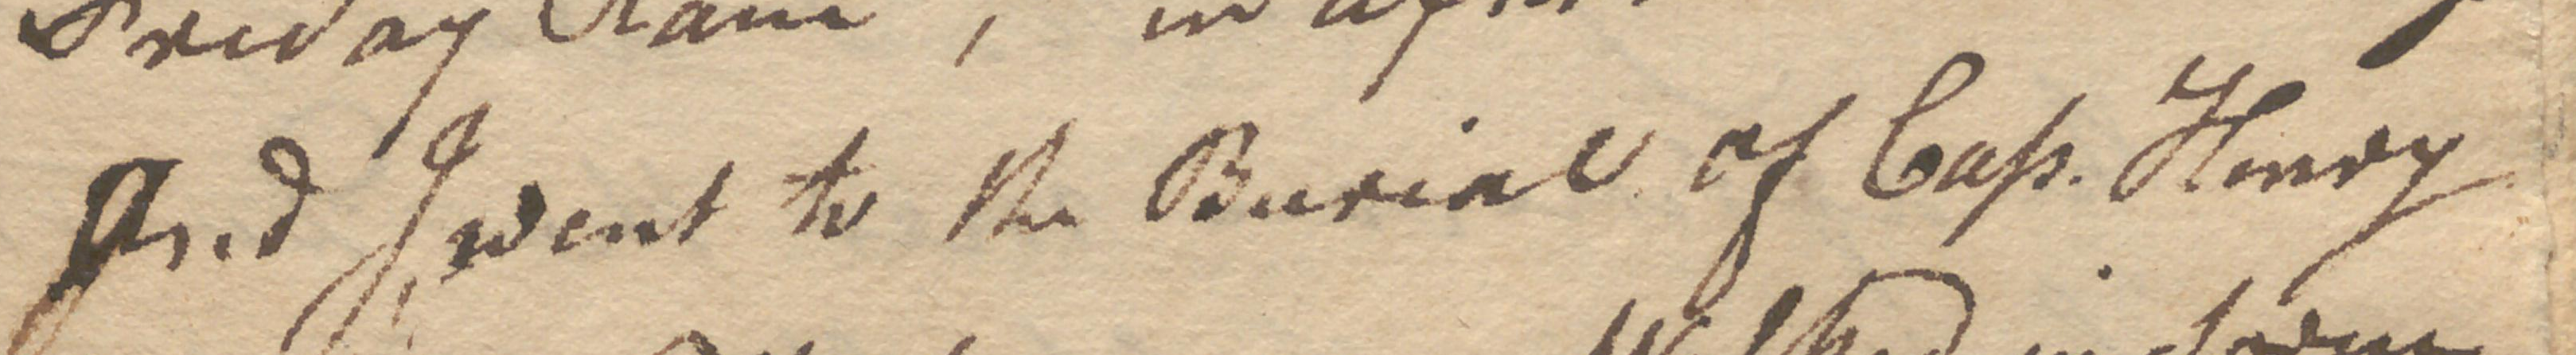And I went to the Burial of Cap. Henry
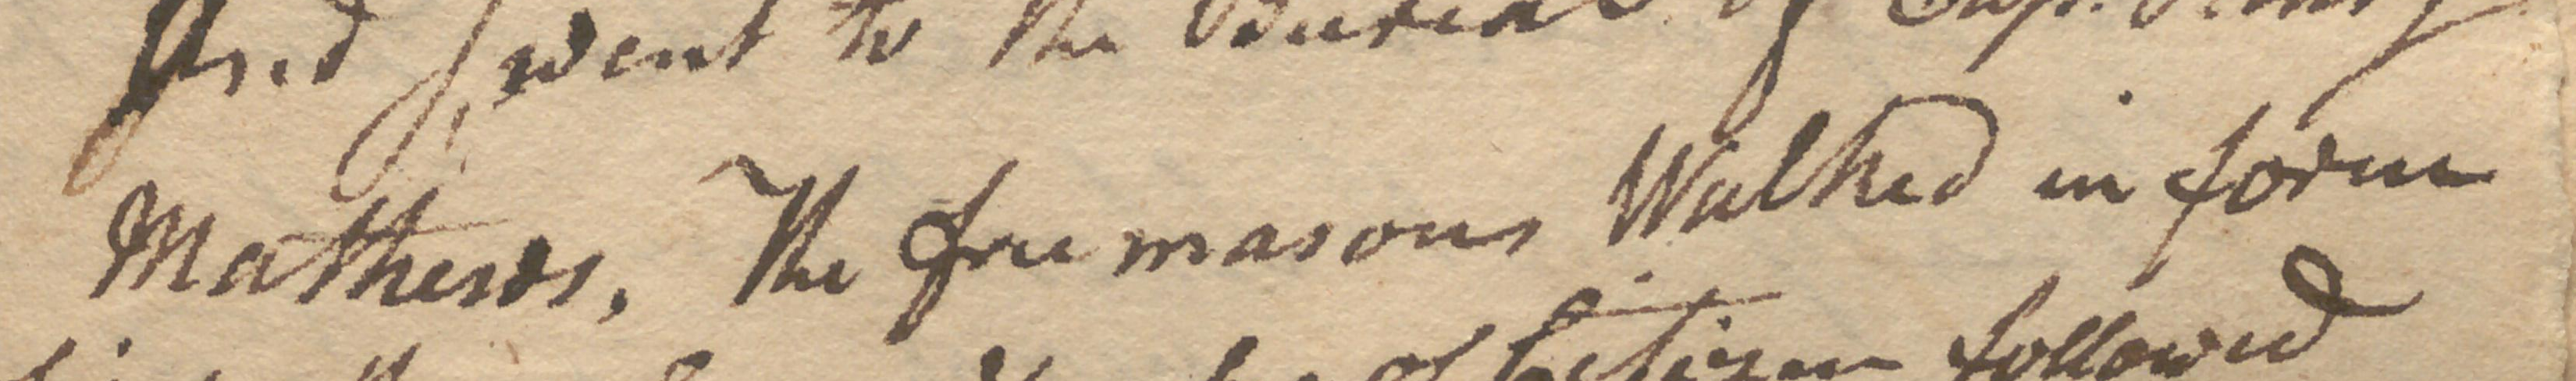Mathews, the fremasons Walked in form
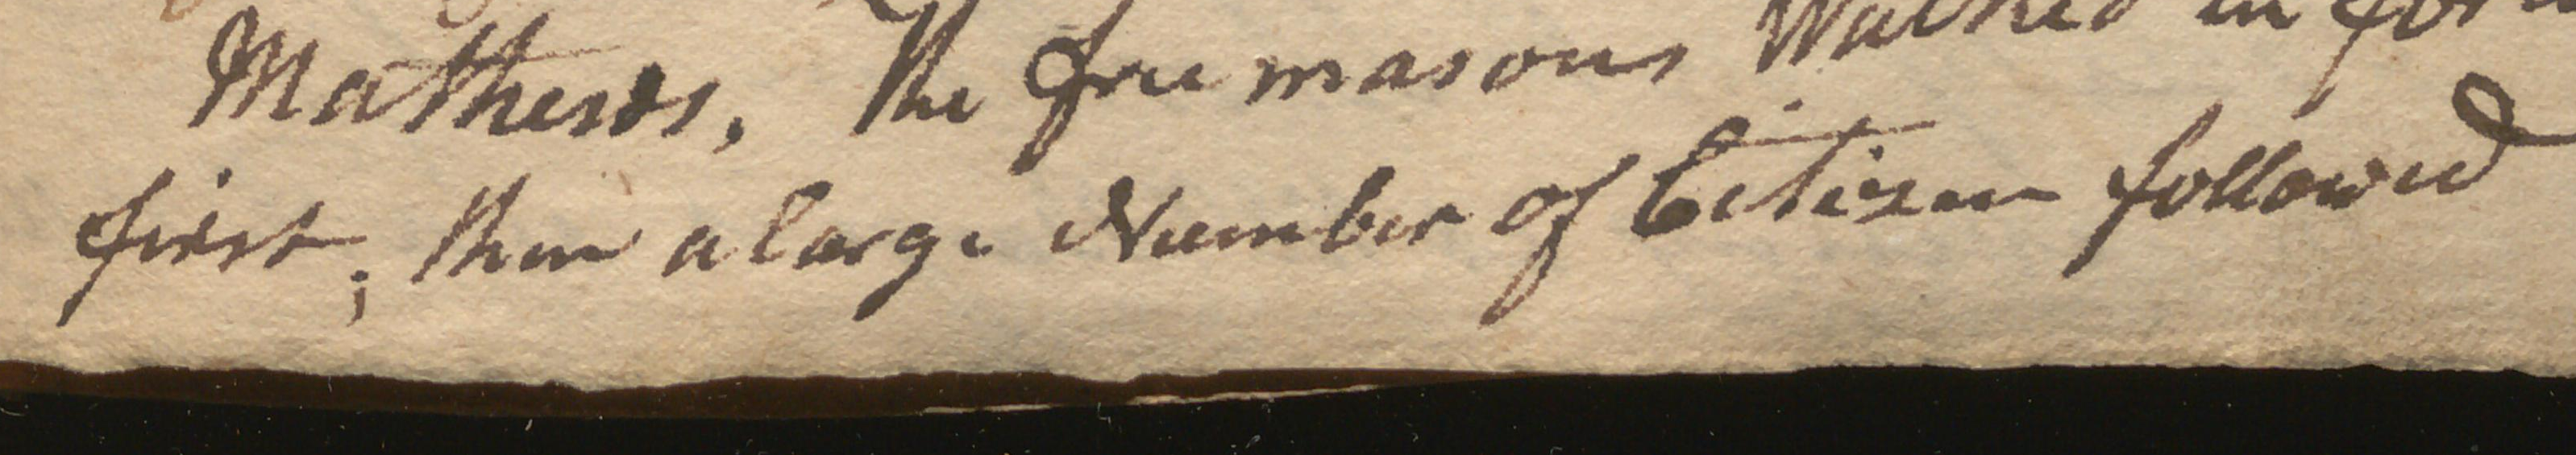frst, than a large Number of Citizen followed
